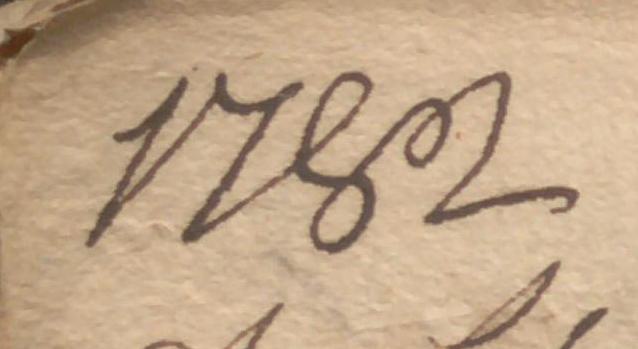1780
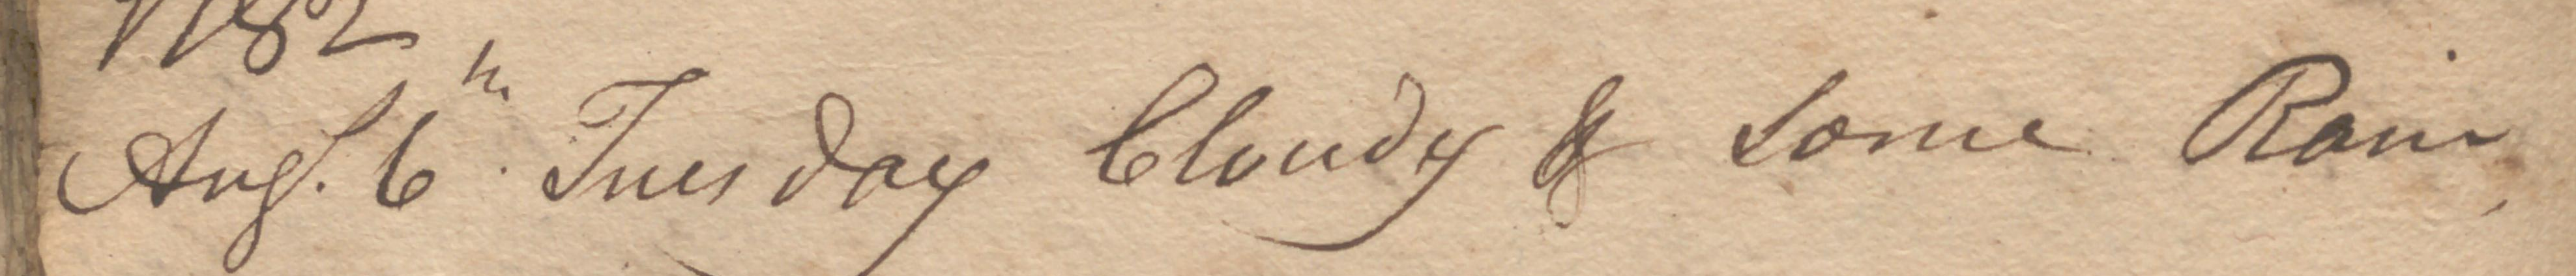Aug^t. 6^th. Tuesday Cloudy & some Rain
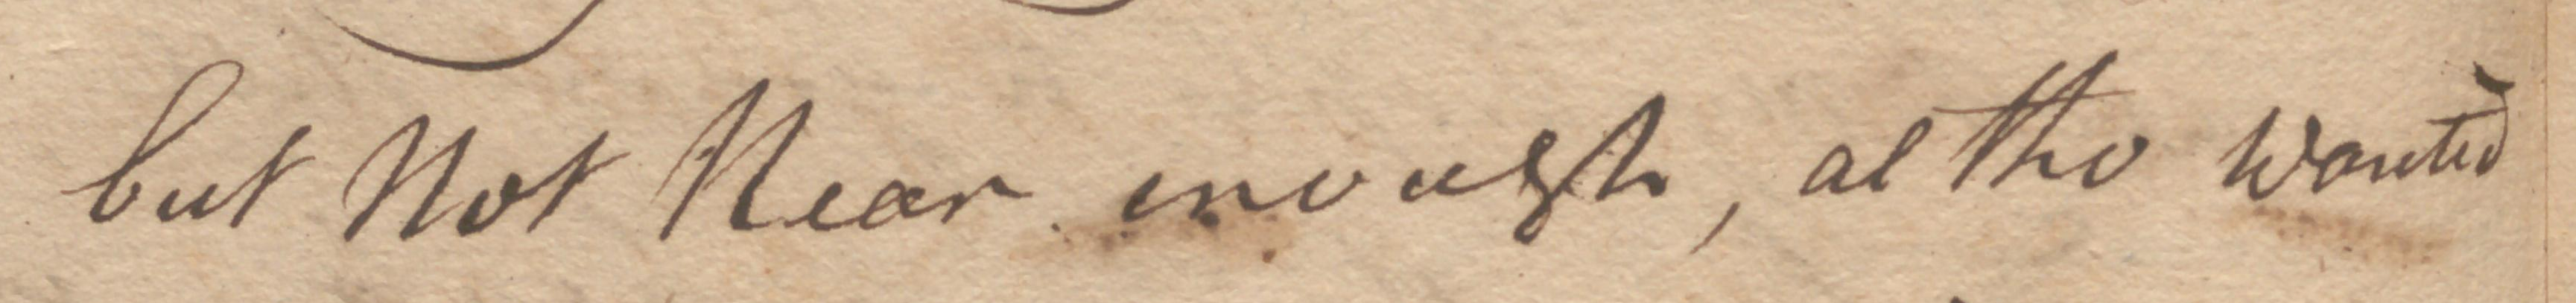but Not Near enough, altho wanted
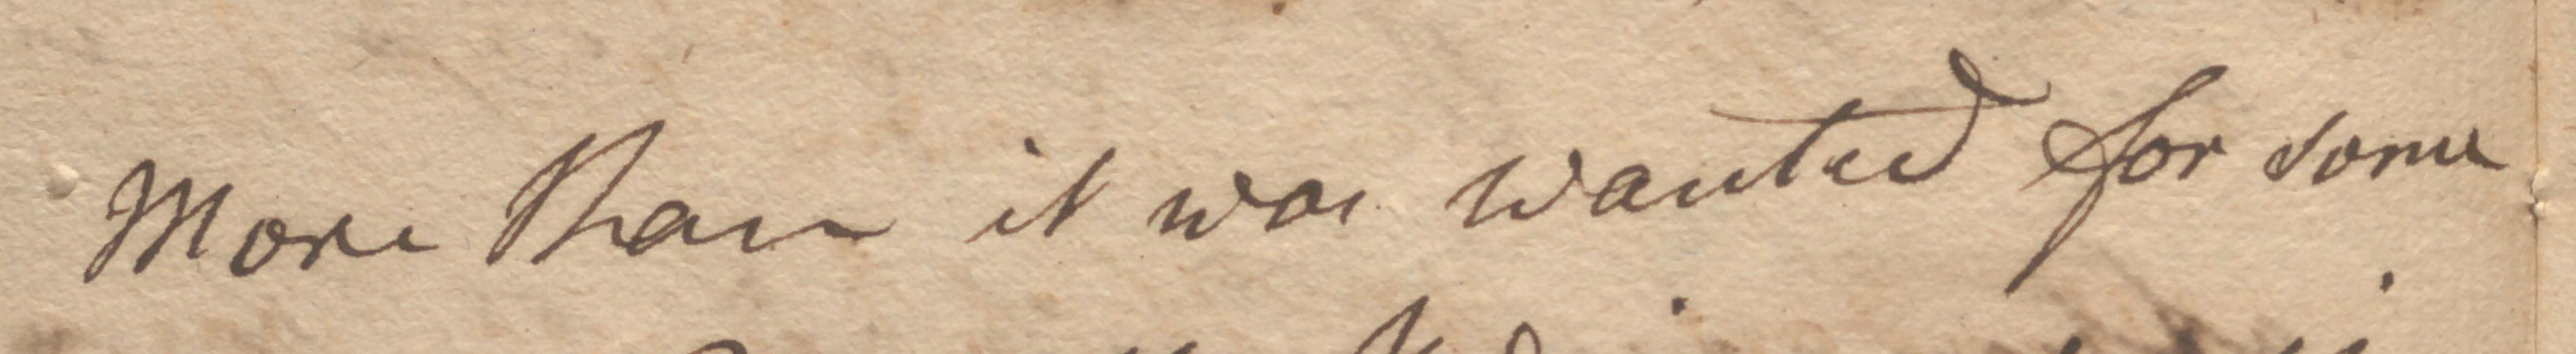More than it was wanted for some
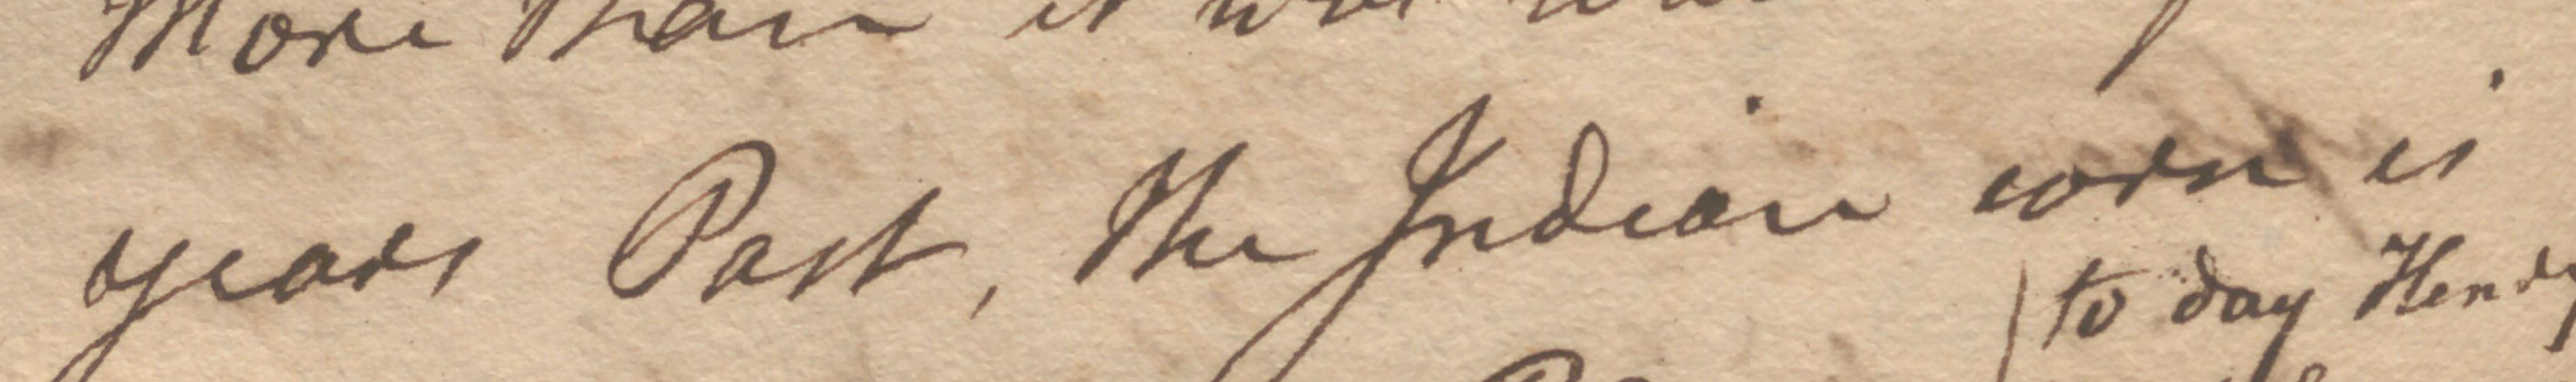years Past the Indian corn is
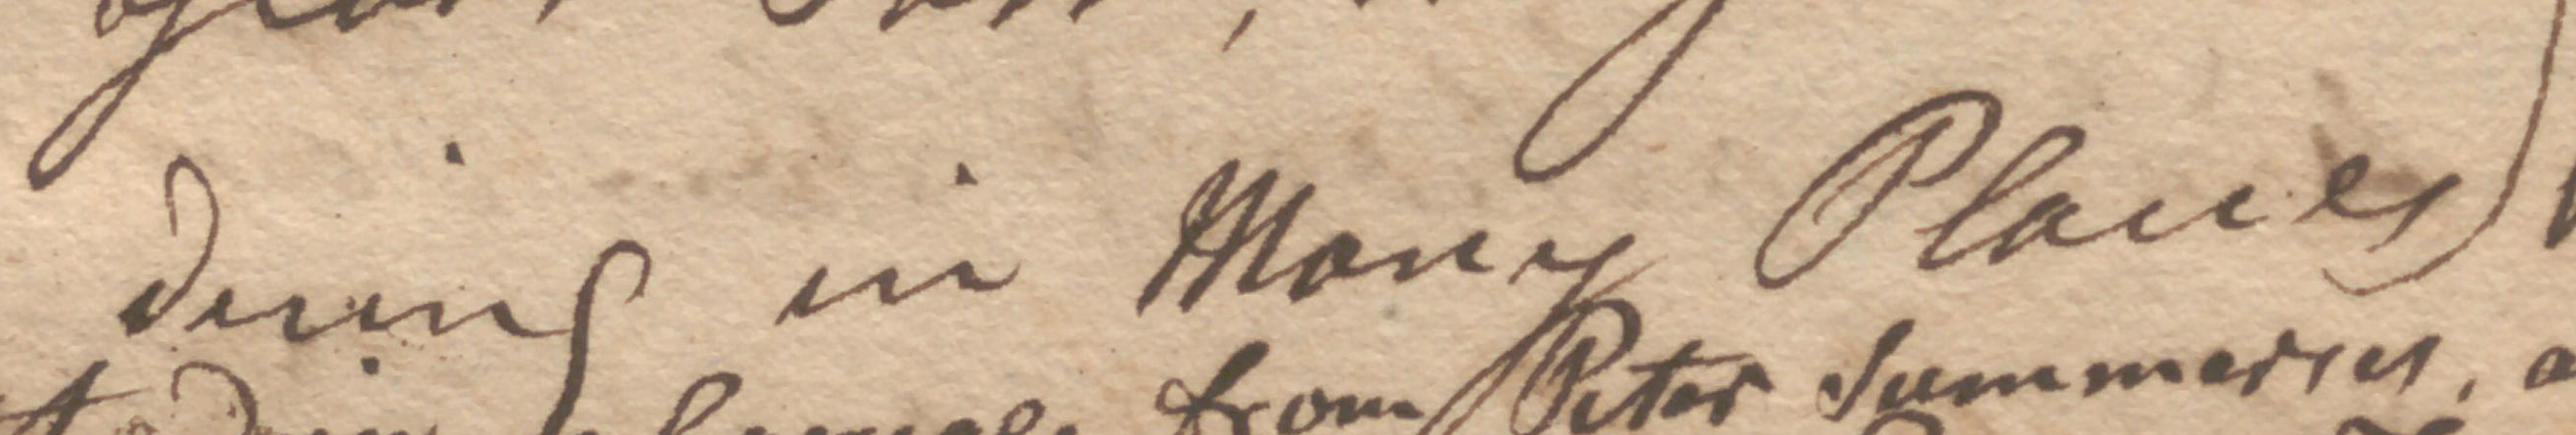diring in Many Places
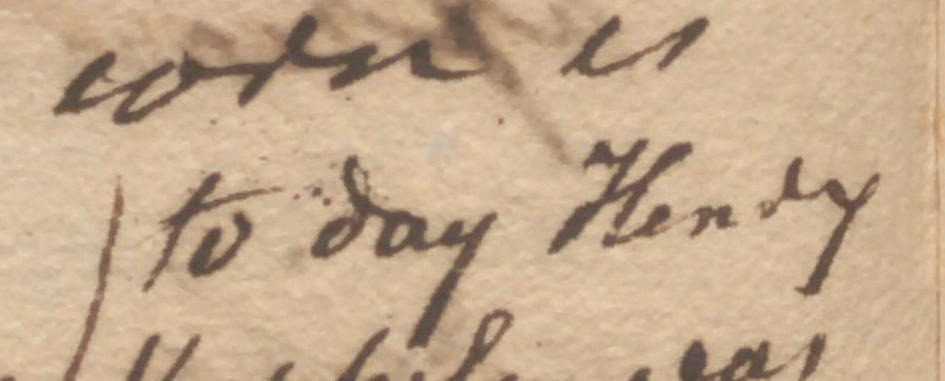to day Henry
